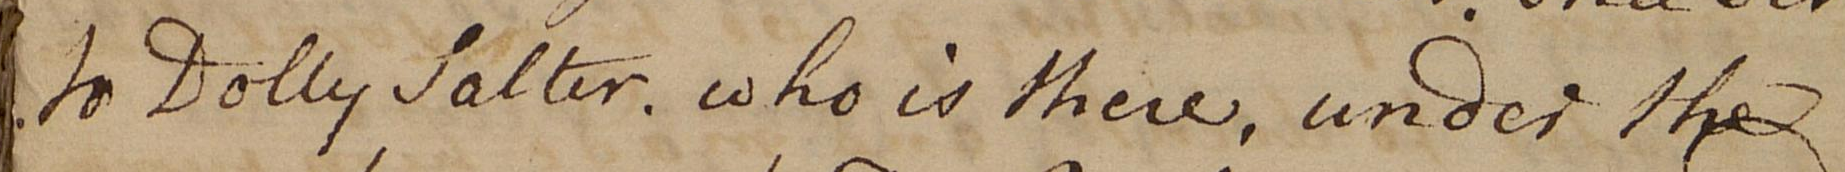to Dolly Salter who is there, under the
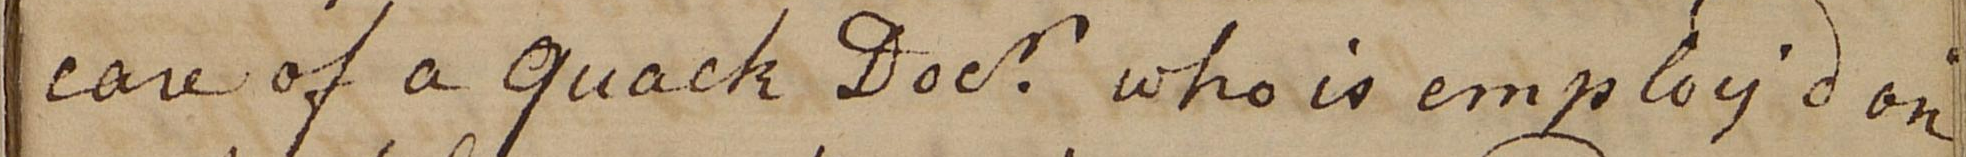care of a Quack Doc^r. who is employ'd on
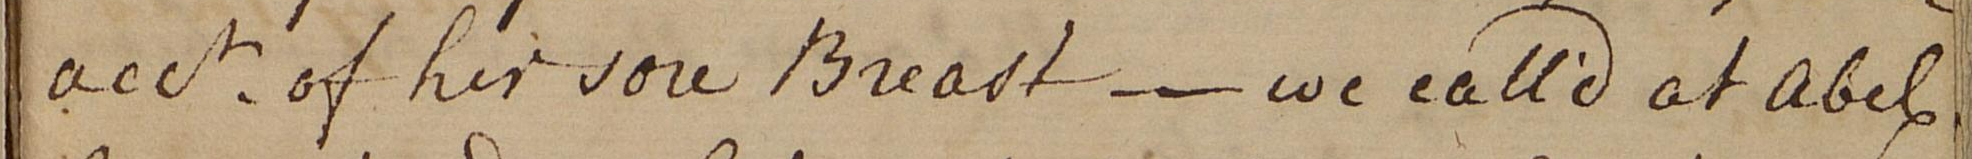acc^t. of her sore Breast- we call'd at Abel
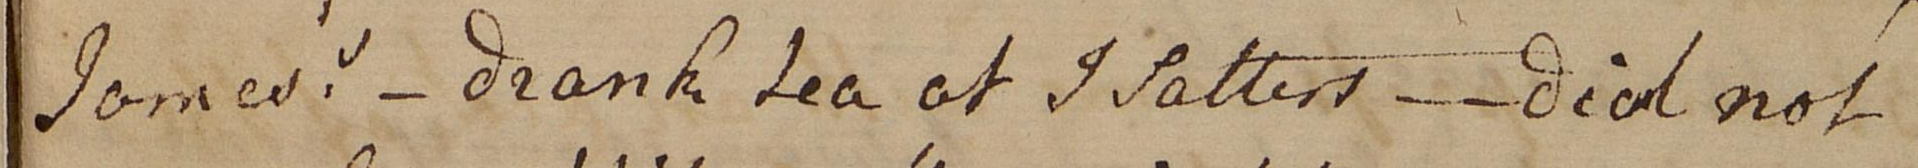James^s.- drank tea at J Satters- did not
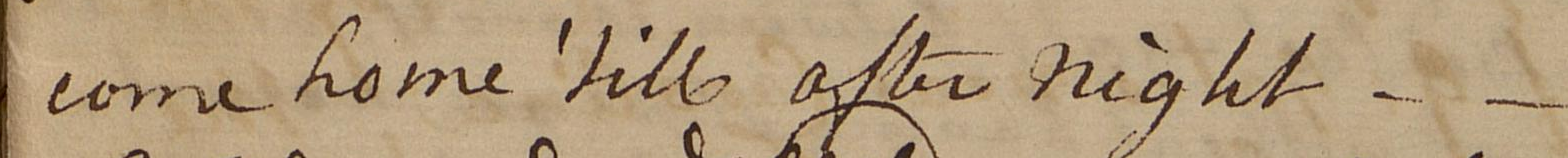come home 'till after Night--
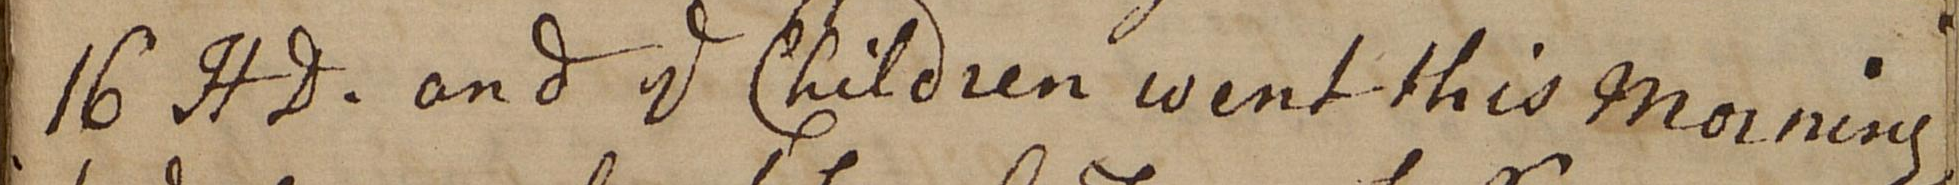16 HD and y^e Children went this morning
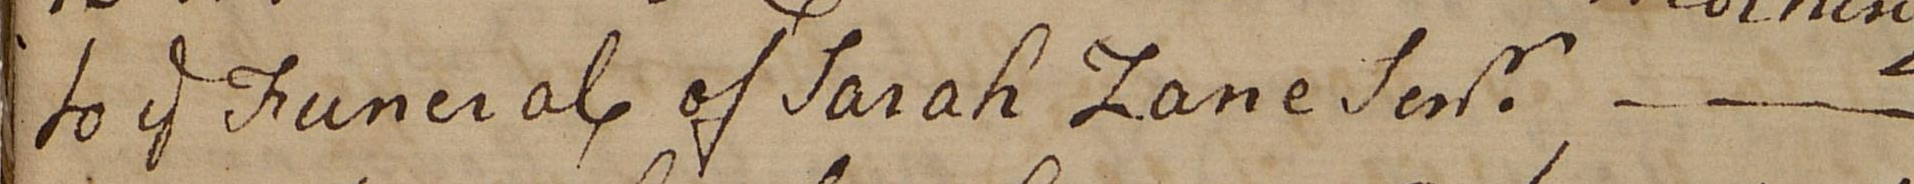to y^e Funeral of Sarah Zane Sen^r.--
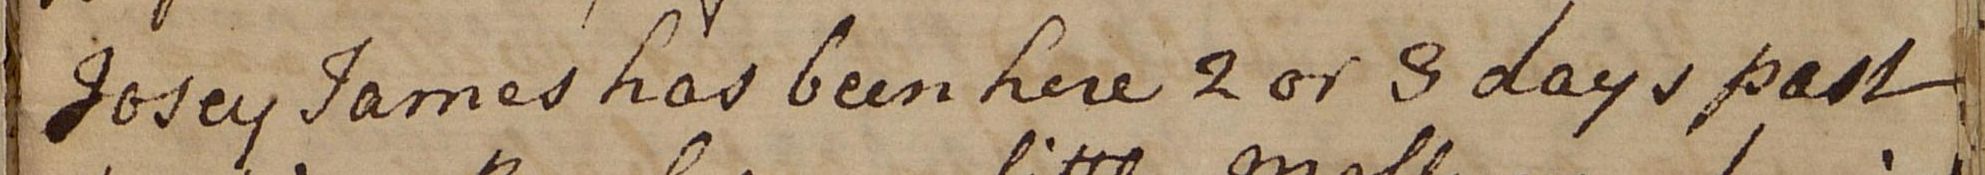Josey James has been here 2 or 3 days past
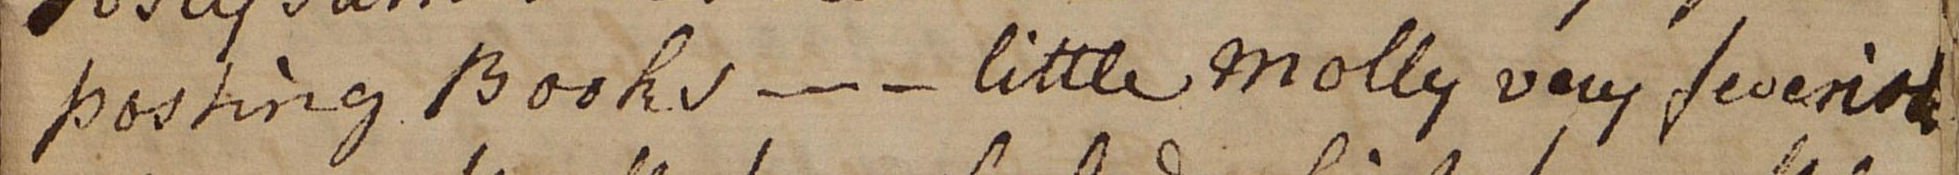posting Books-- little Molly very feverish
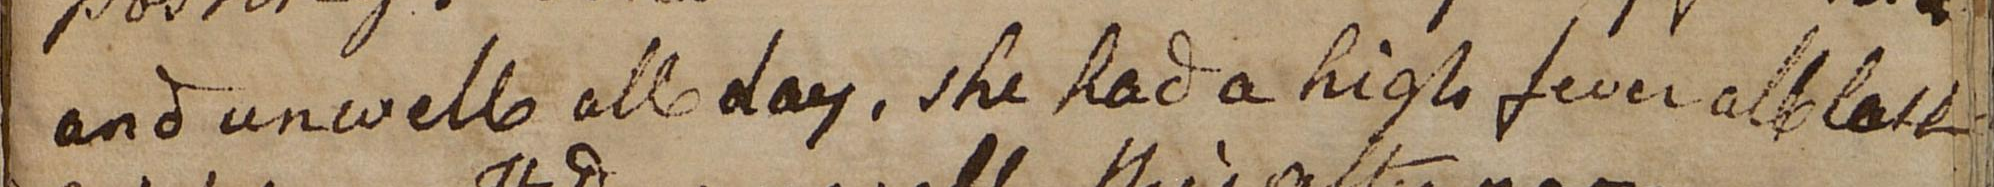and unwell all day, she had a high fever all late
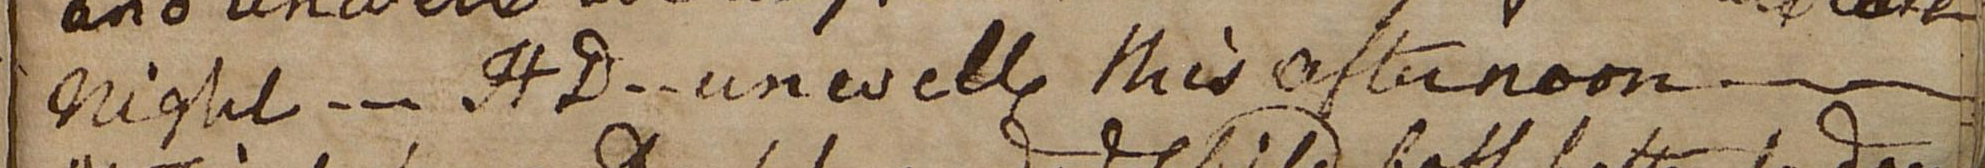Night.- HD--unwell this afternoon-
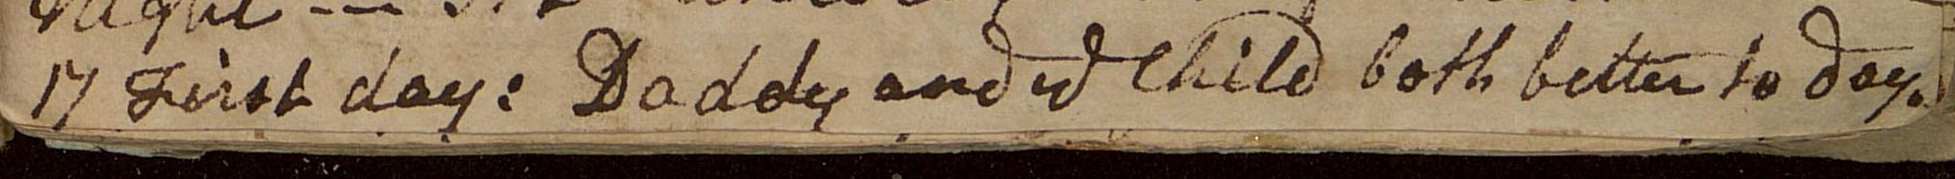17 First day: Daddy and y^e child both better to day.
